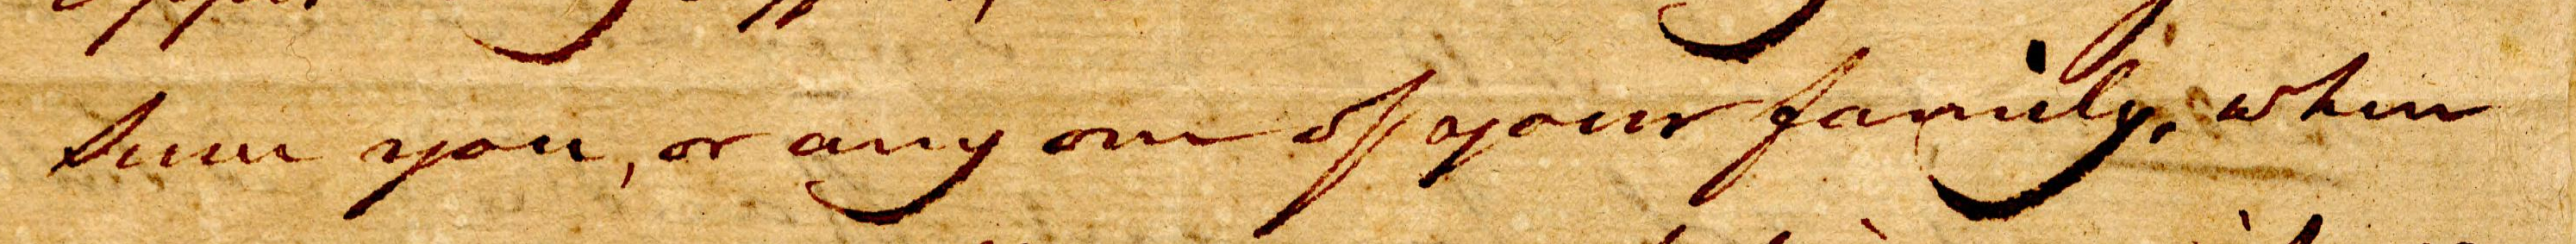serve you, or any one of your family, when
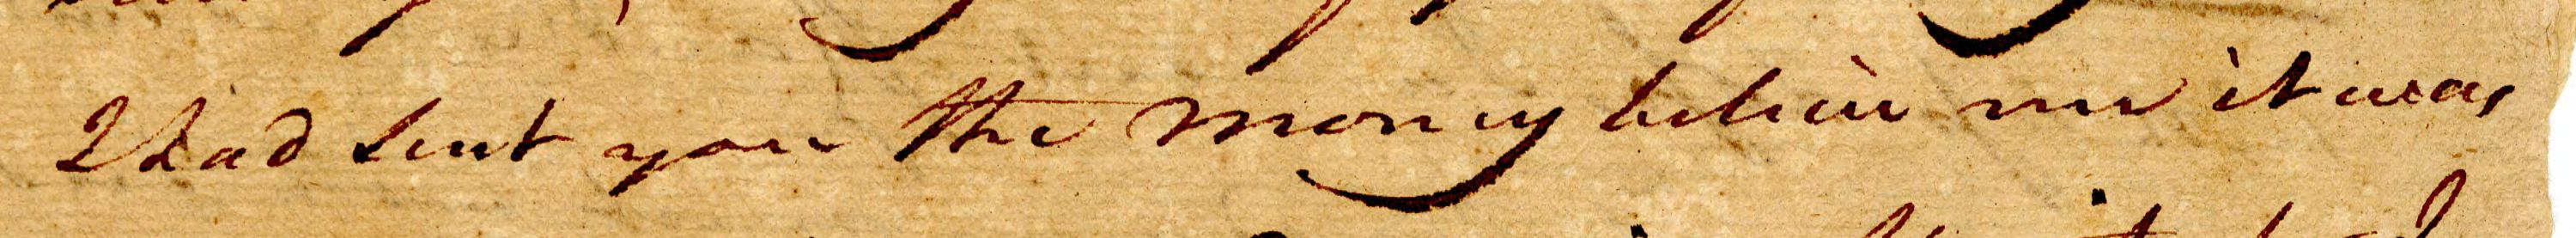I had Sent you the money believe me it was
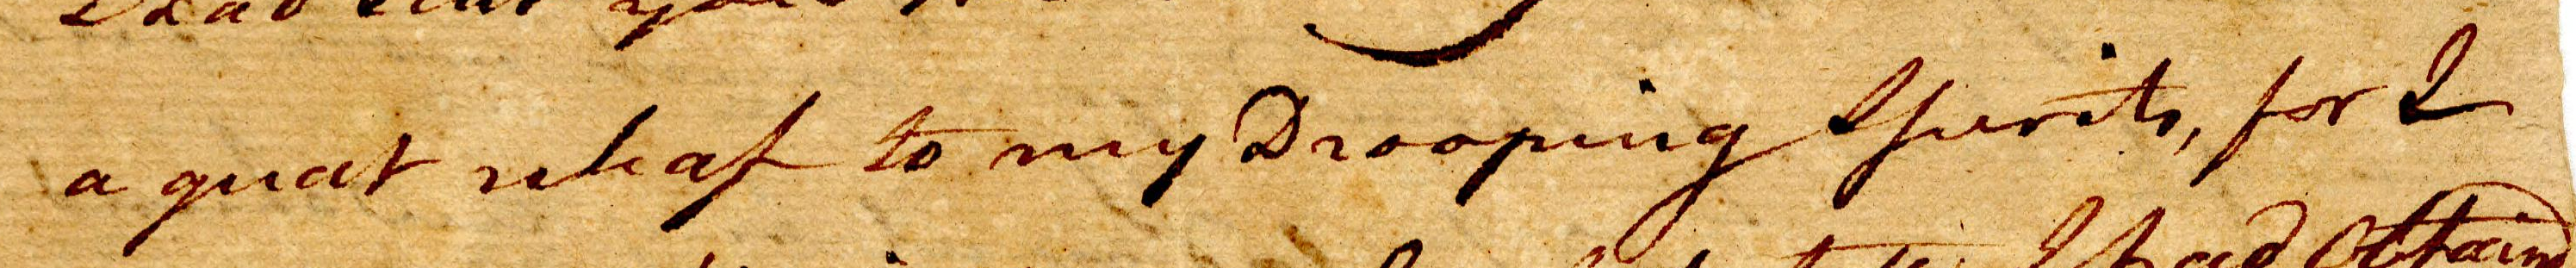a great relief to my drooping spirits, for I
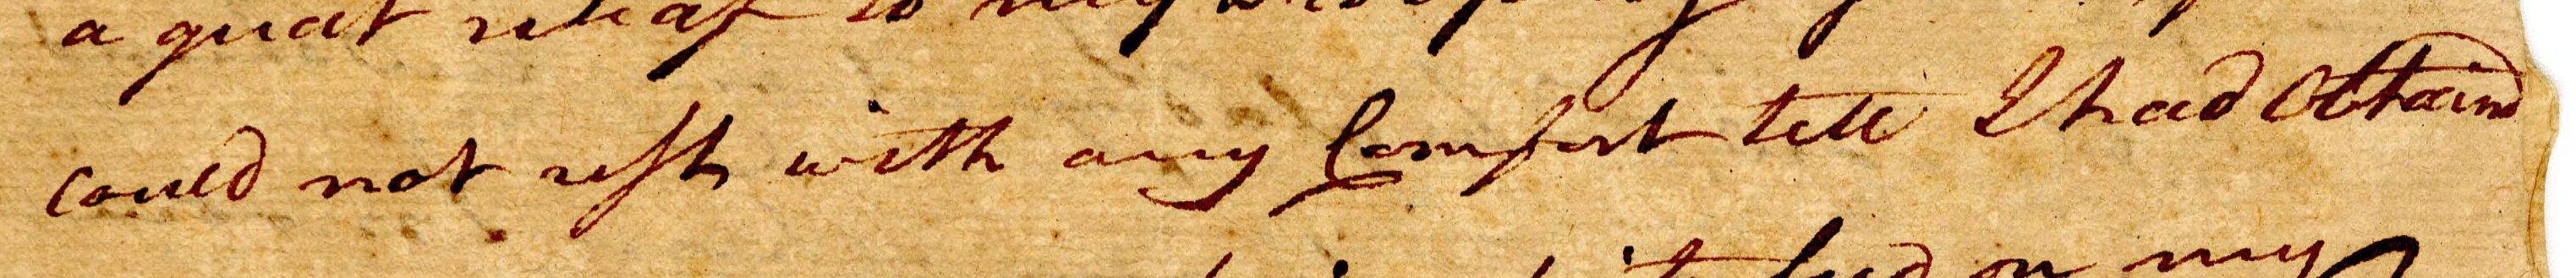could not rest with any Comfort till I had Obtaind
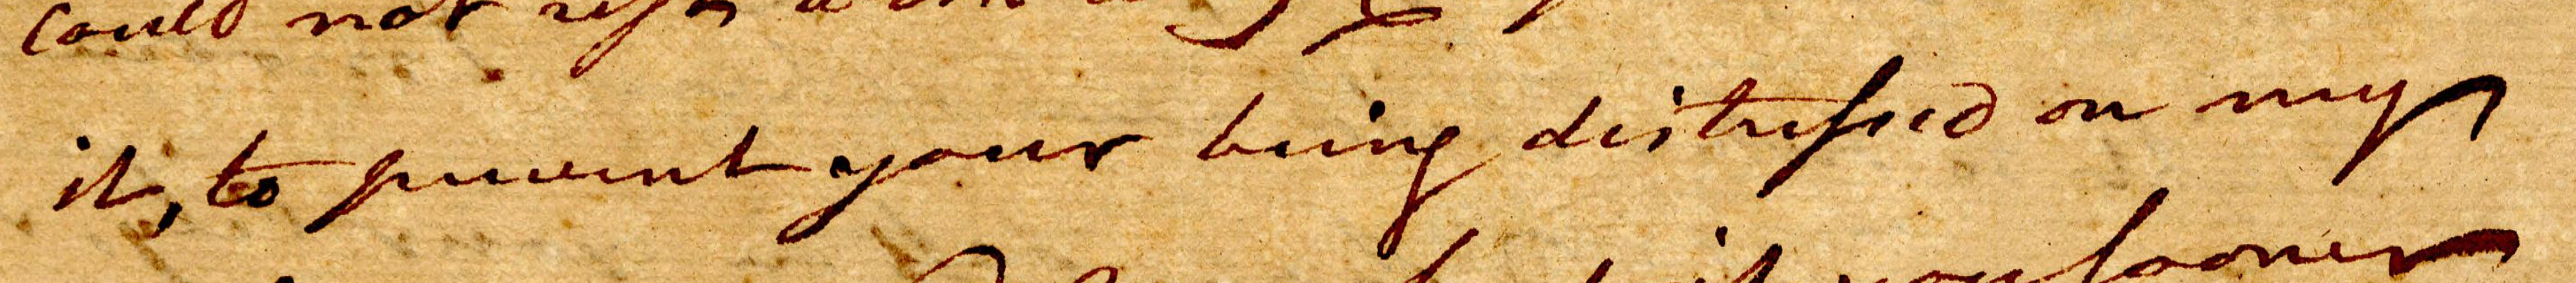it to prevent your being distressed on my
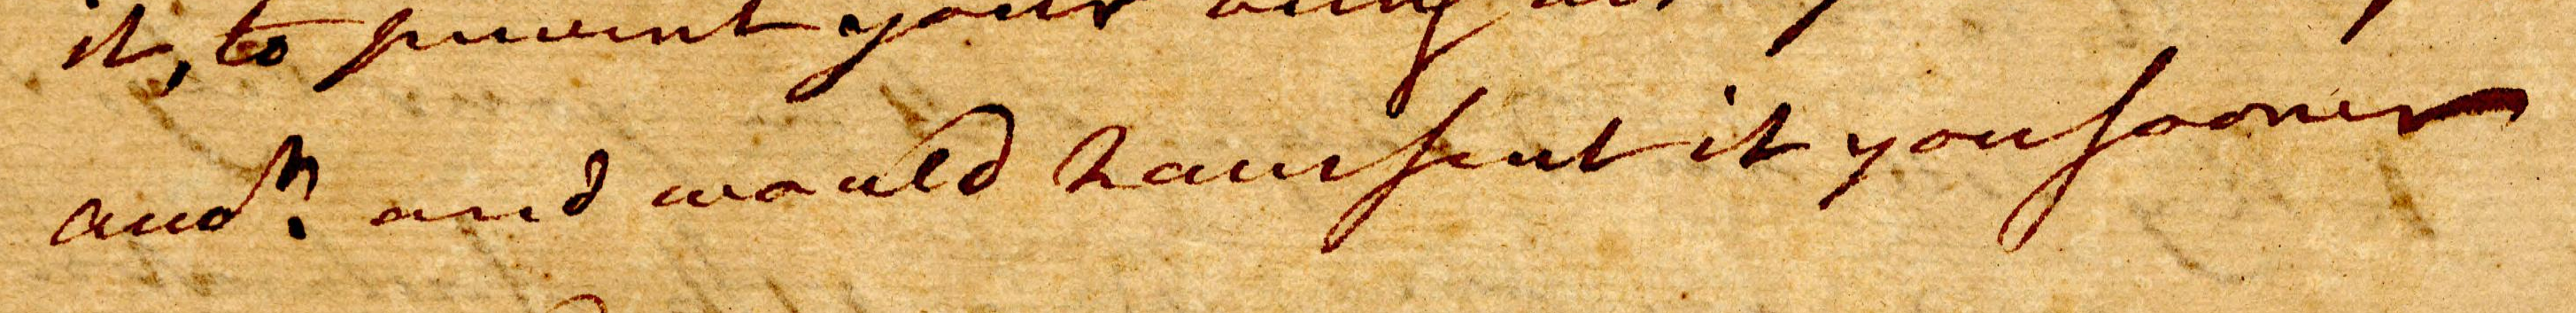acco^t. and would have sent it you sooner
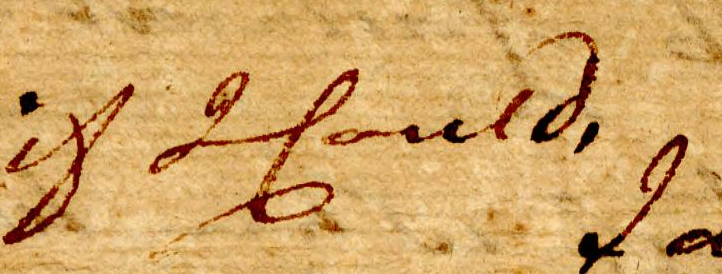if I could
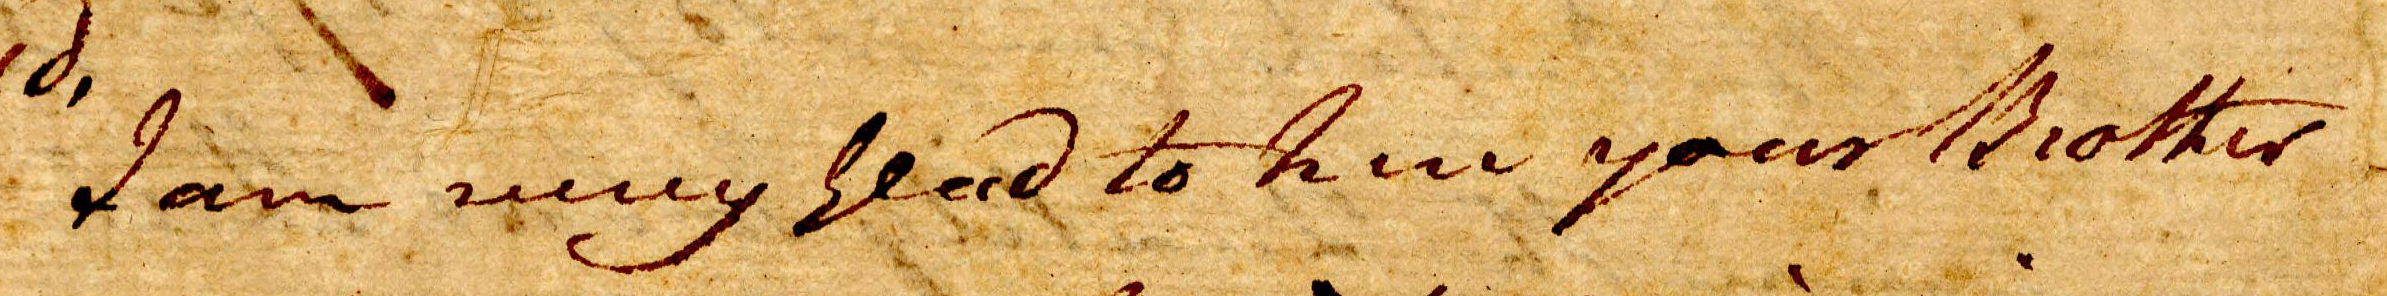I am very glad to here your brother
